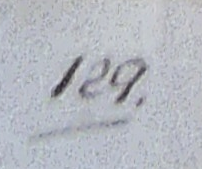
129.
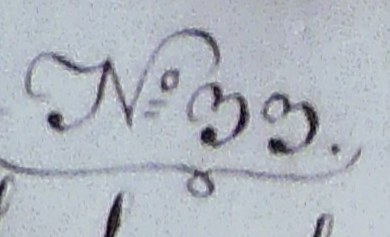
No͇ 33.
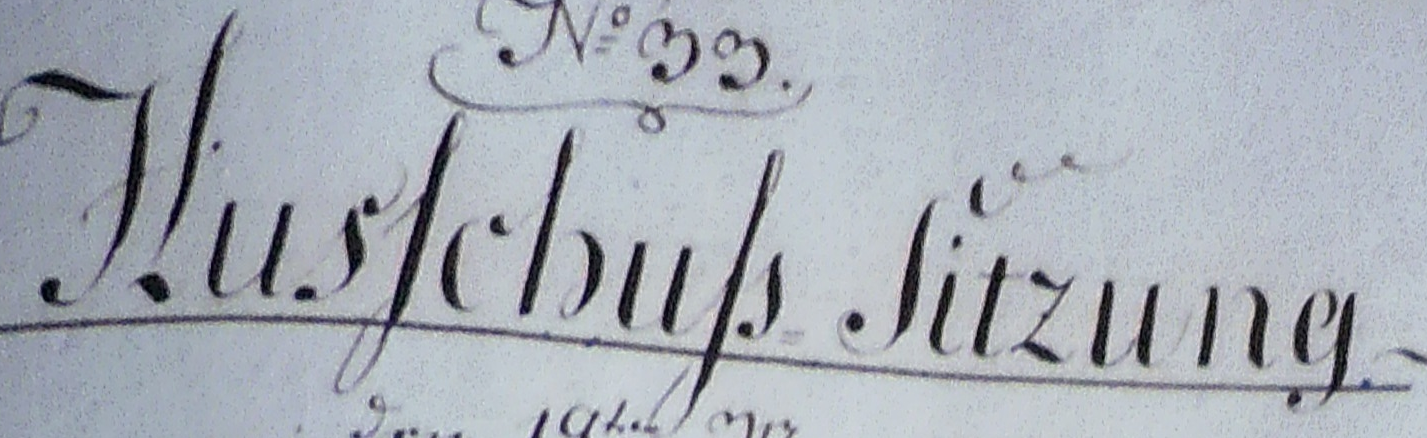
Ausschuss‗Sitzung.
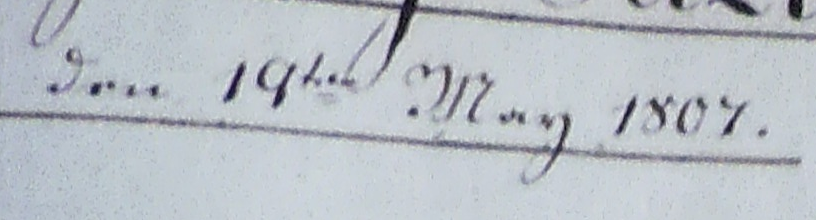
den 19te͇n May 1807.
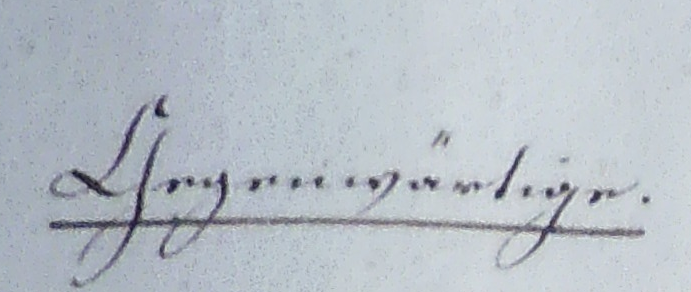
Gegenwärtige.
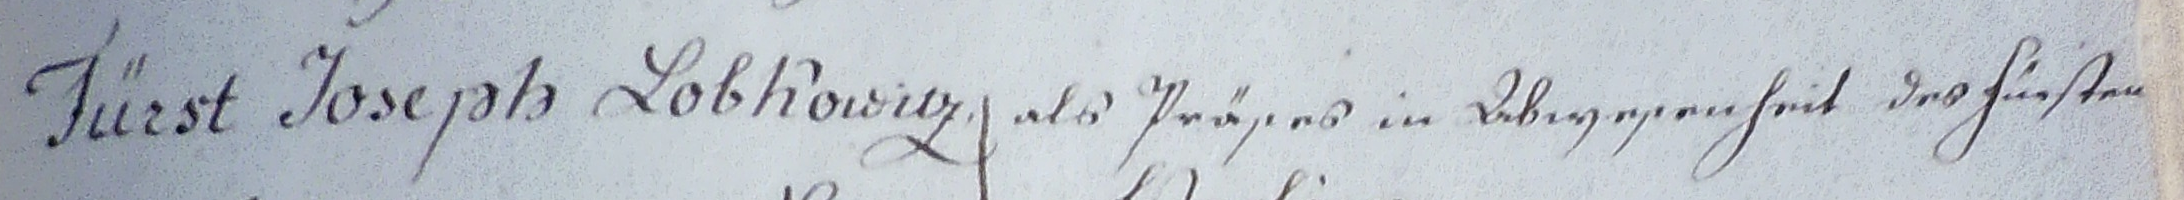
Fürst Joseph Lobkowitz als Präses in Abwesenheit des Fürsten
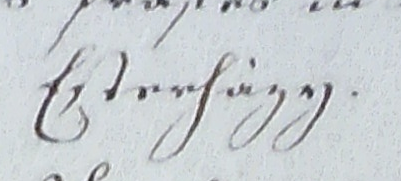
Esterhàzy.
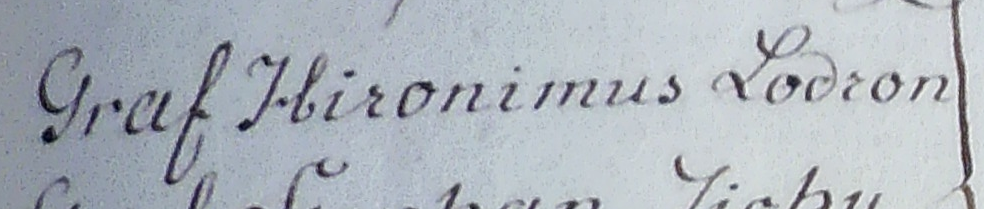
Graf Hironimus Lodron
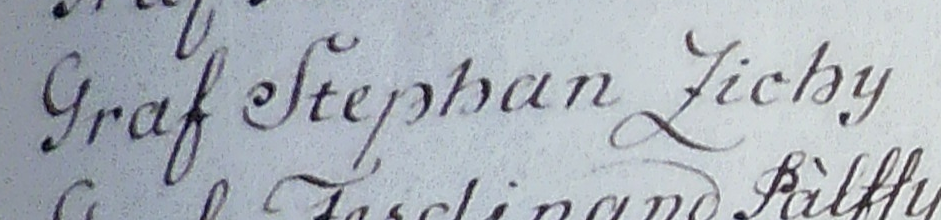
Graf Stephan Zichy
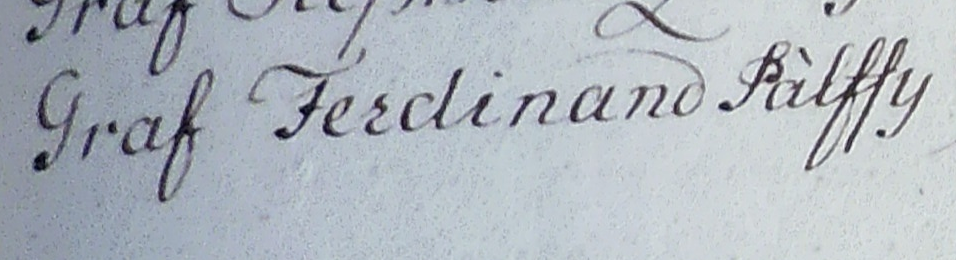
Graf Ferdinand Pàlffy
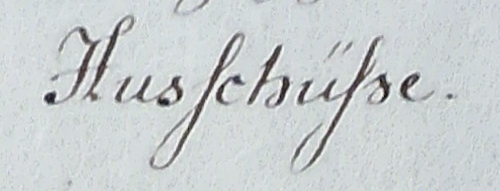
Ausschüsse.
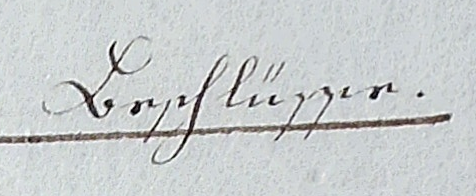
Beschlüsse.
